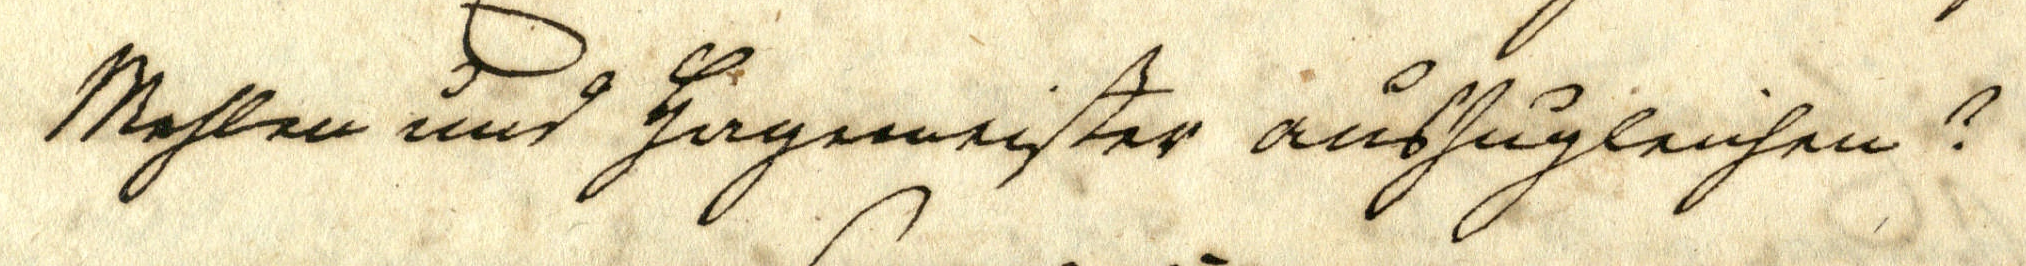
Mehlen und Hagemeister auszugleichen?
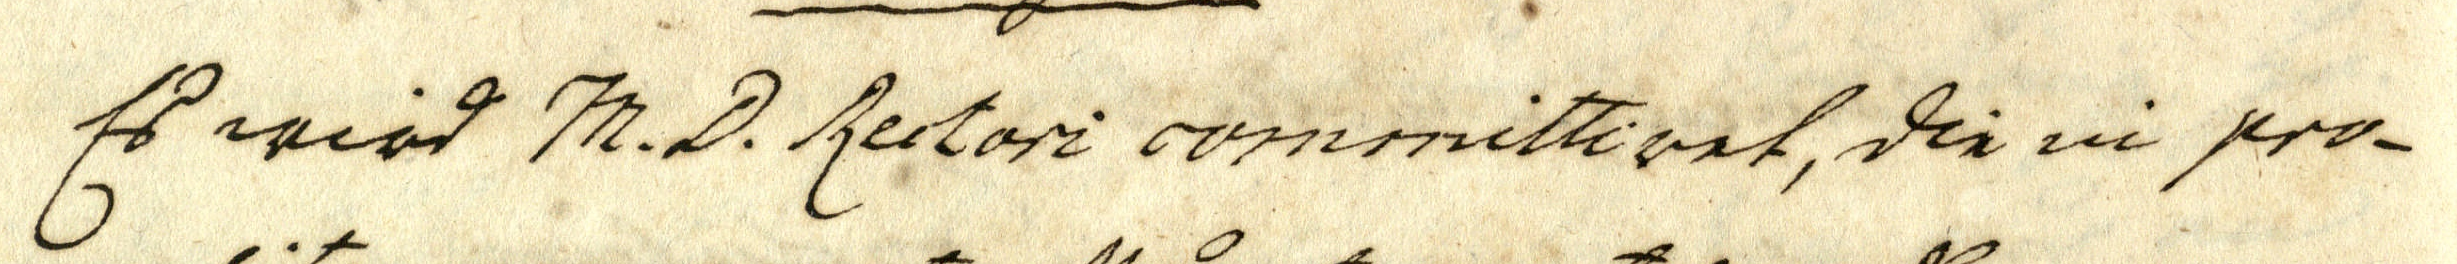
Es wird M. D. Rectori committiret, die in pro¬
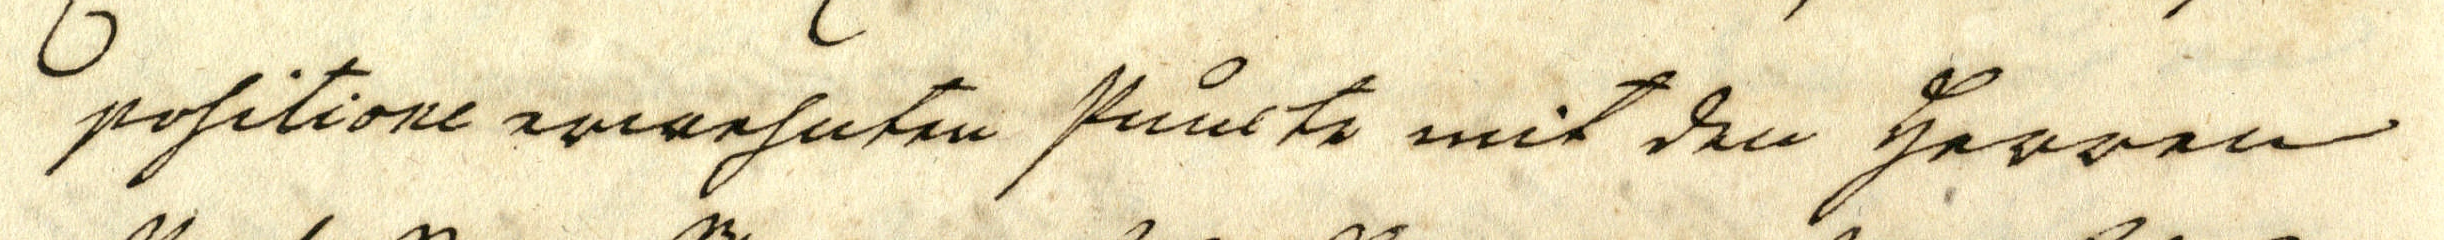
positione erwehnten Puncte mit den Herren
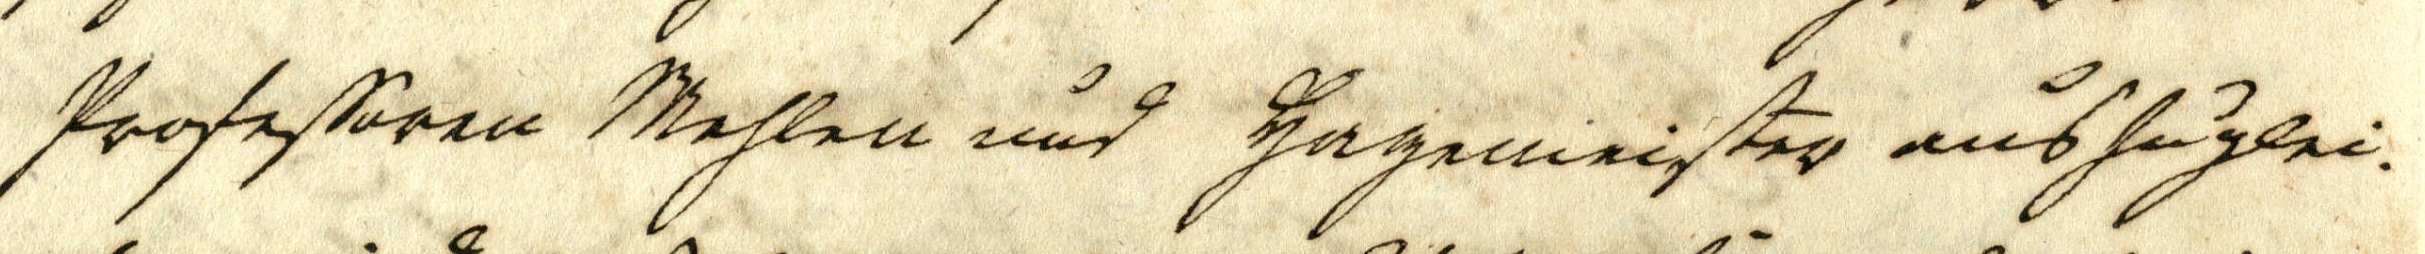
Professoren Mehlen und Hagemeister auszuglei¬
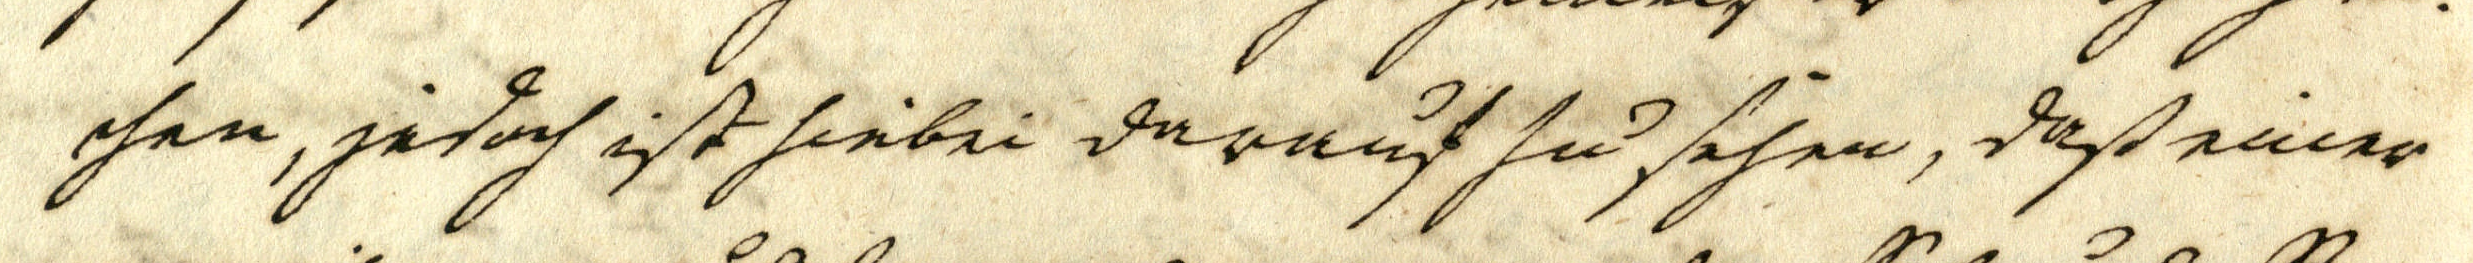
chen, jedoch ist hiebei darauf zu sehen, daß einer
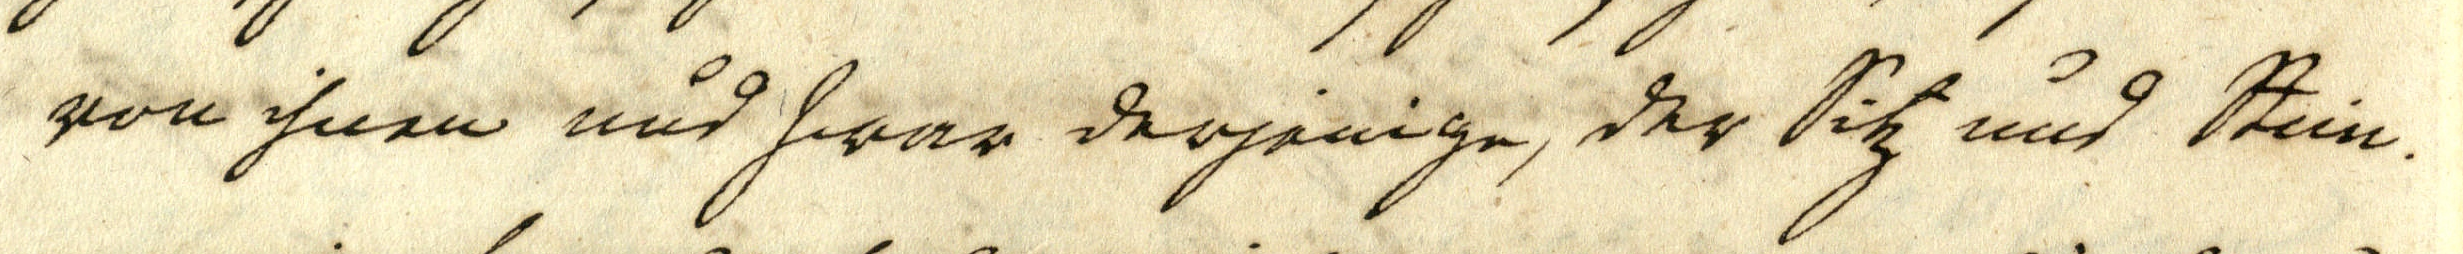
von ihnen und zwar derjenige, der Sitz und Stim¬
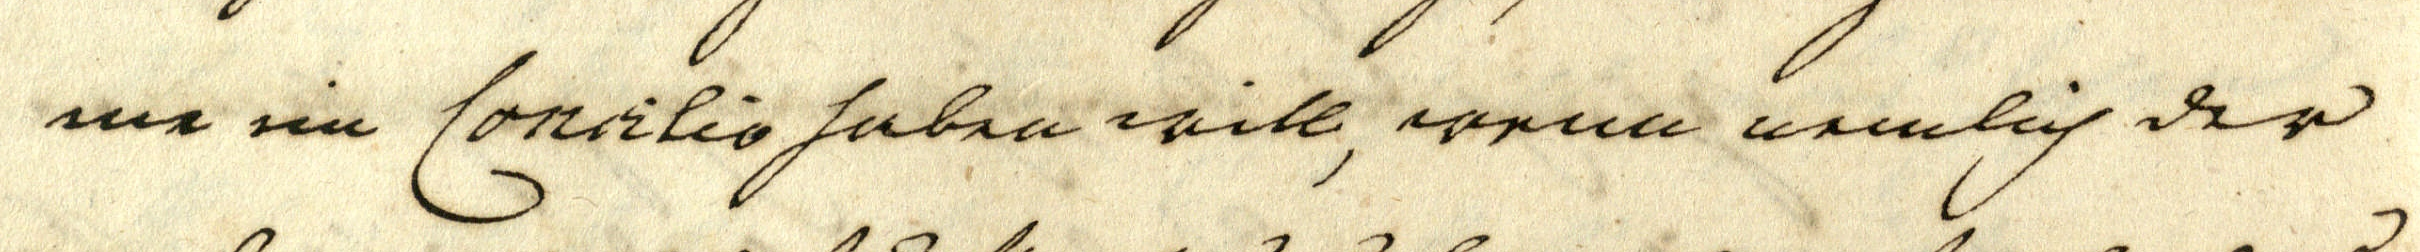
me im Concilio haben will, wenn nemlich der
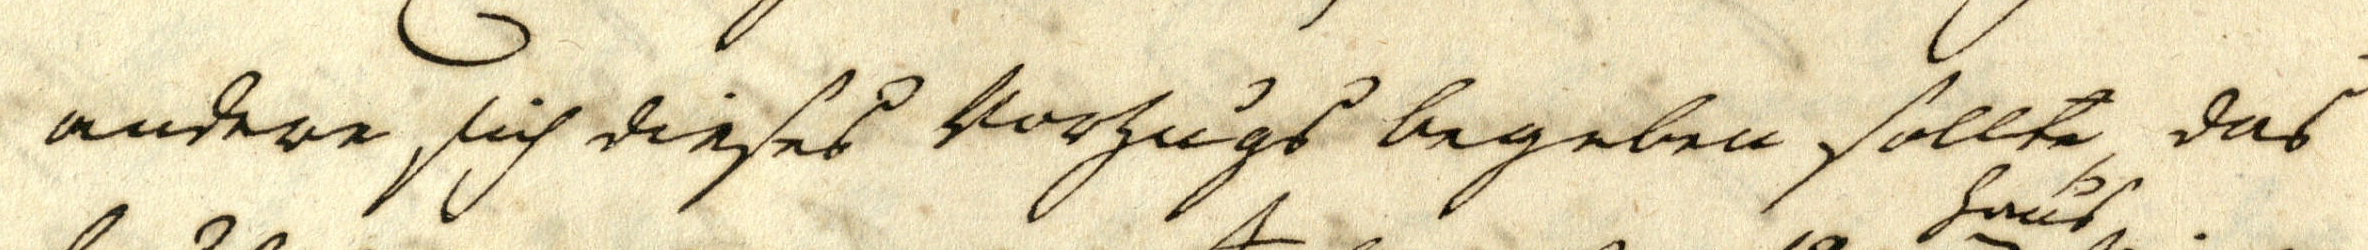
andere sich dieses Vorzugs begeben sollte, das
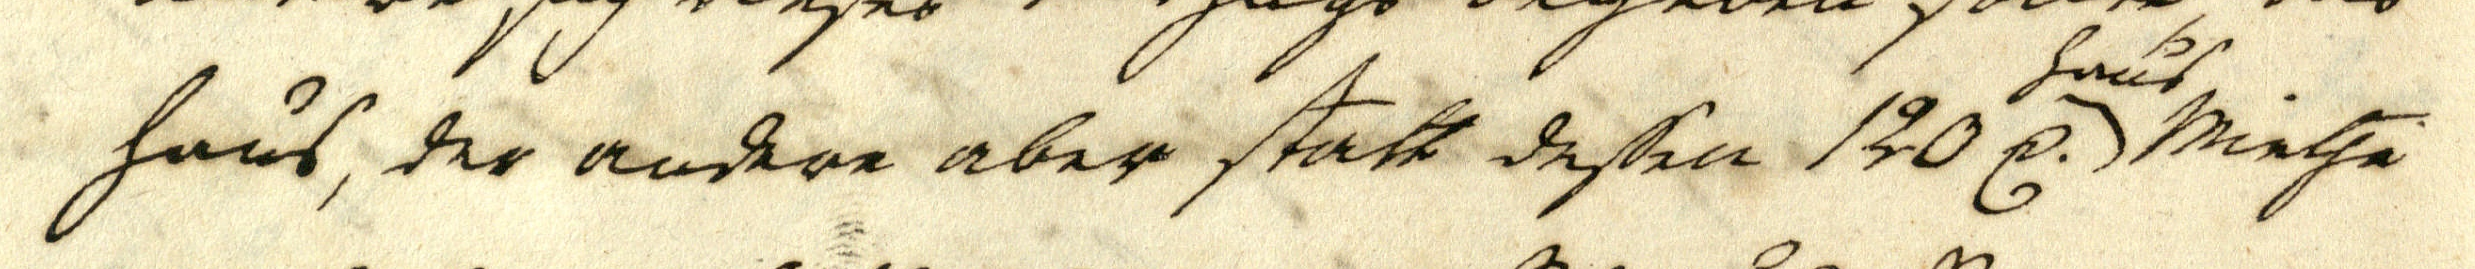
Haus, der andere aber statt dessen 120 l. Haus Miethe
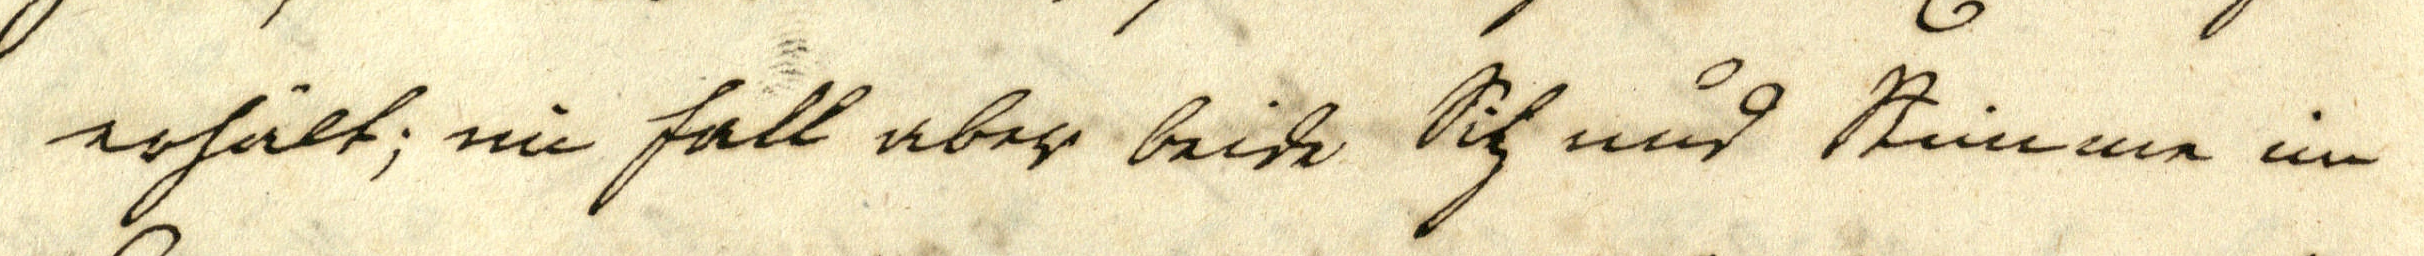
erhält, im Fall aber beide Sitz und Stimme im
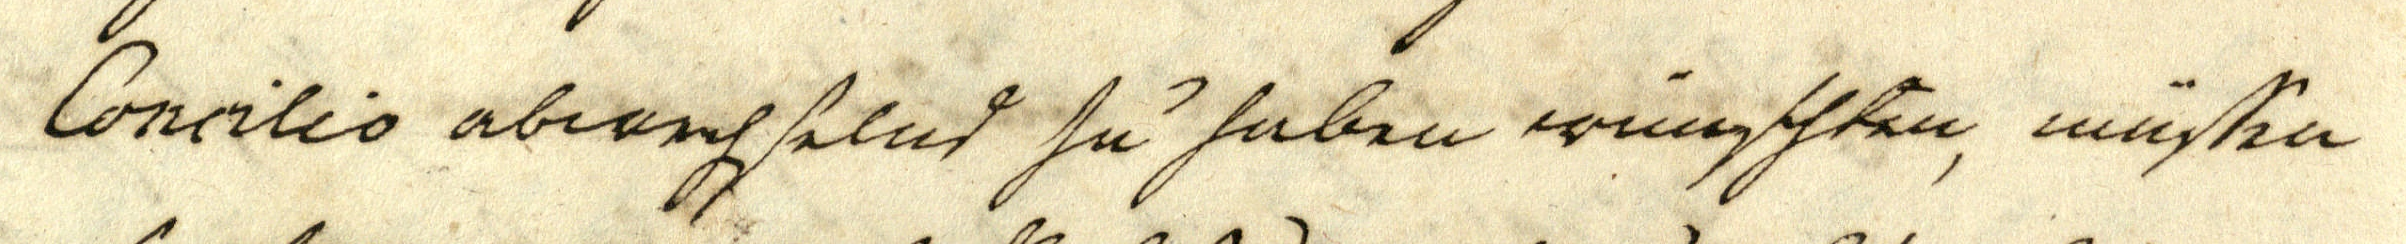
Concilio abwechselnd zu haben wünschten, müssen
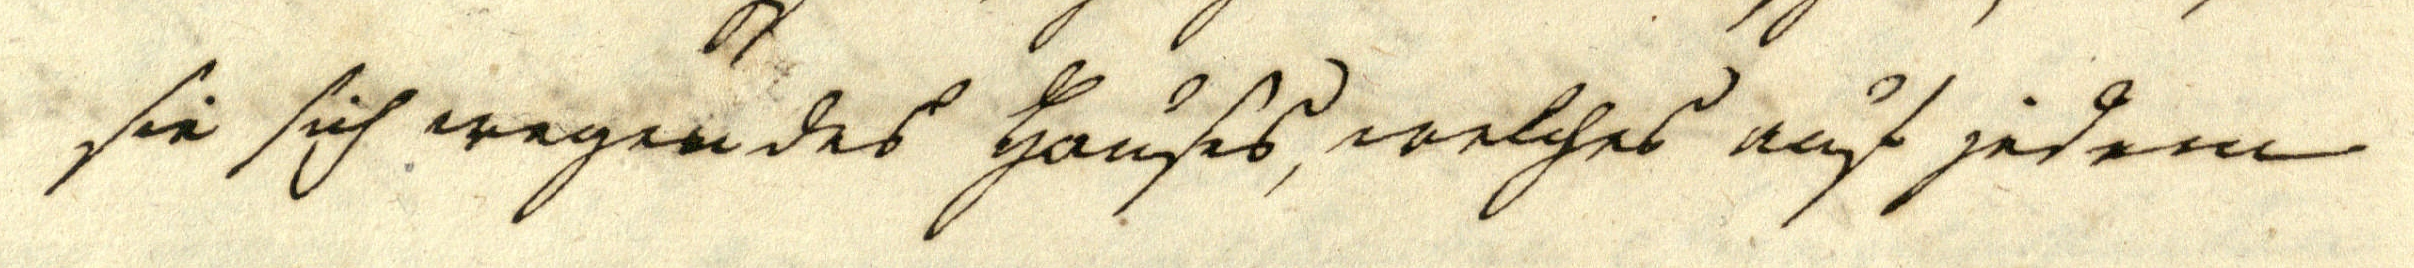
sie sich wegen des Hauses, welches auf jedem
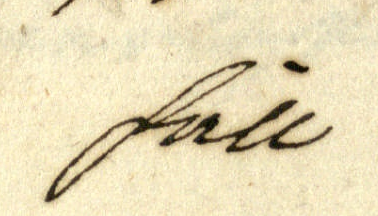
Fall
